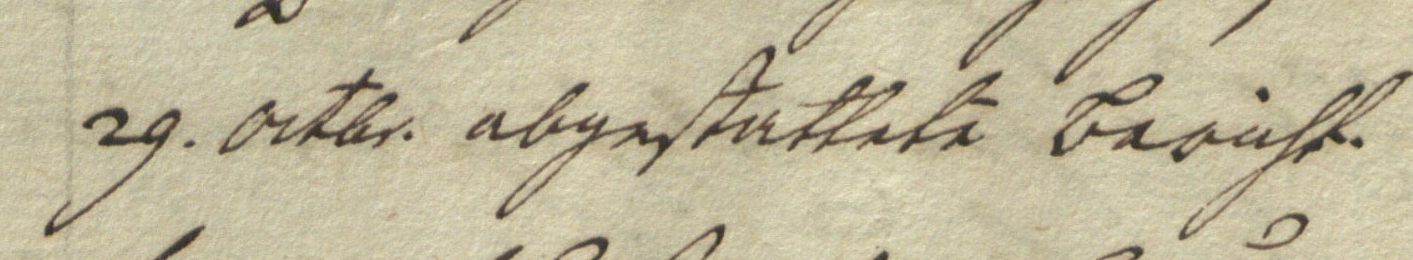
29. Octbr. abgestattete Bericht.
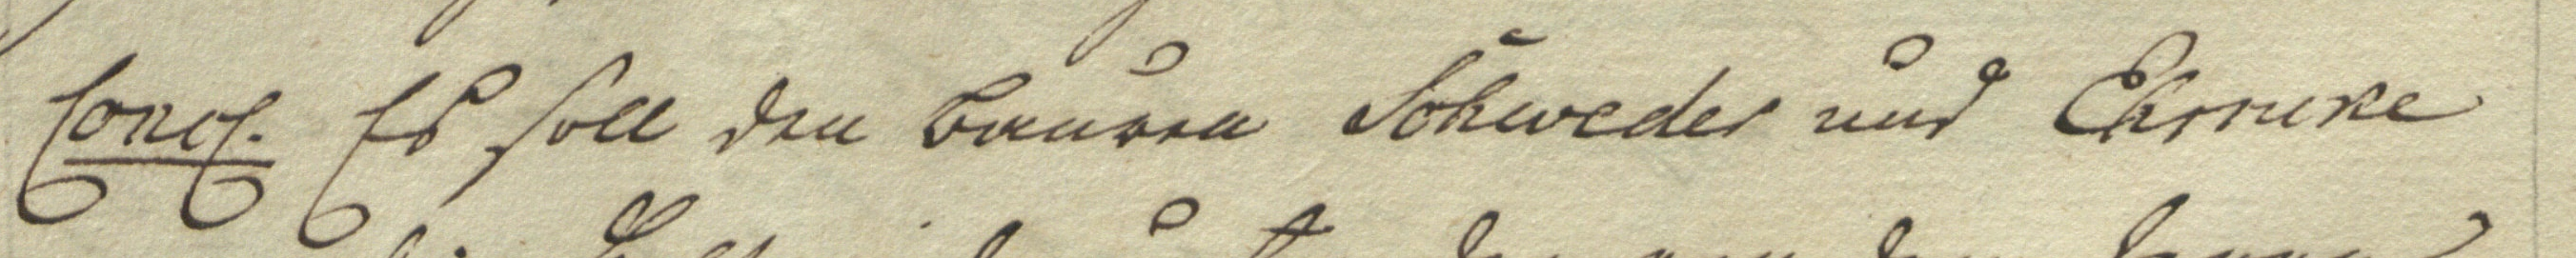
Concl. Es soll den Bauren Shweder und Ehmcke
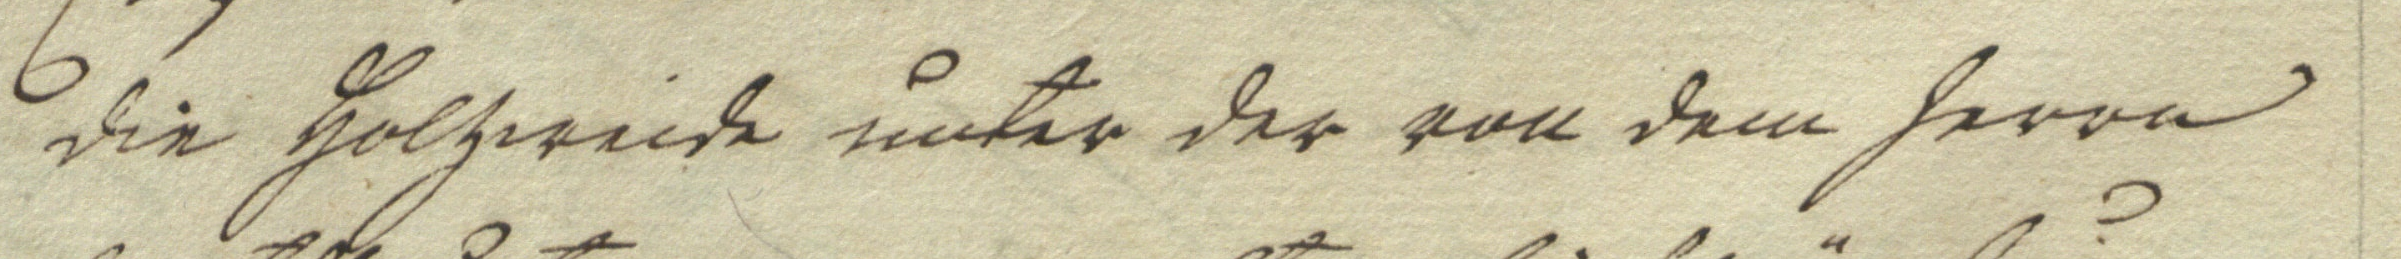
die Holzweide unter der von dem Herrn
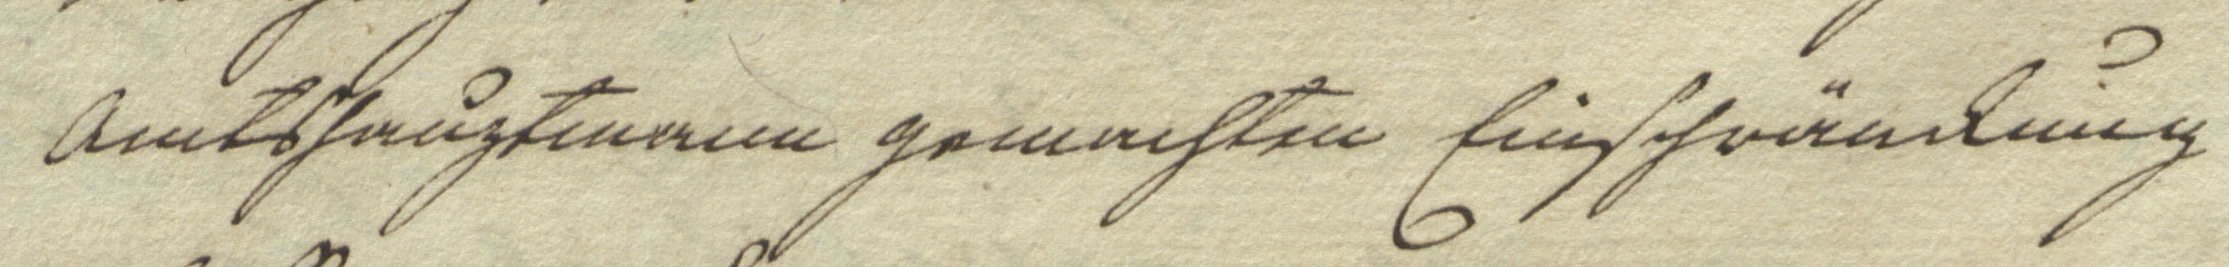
Amtshauptmann gemachten Einschränckung
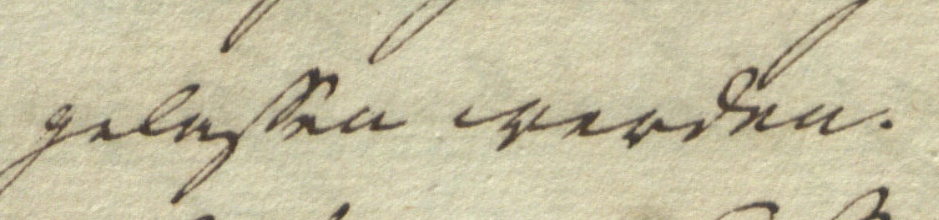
gelassen werden.
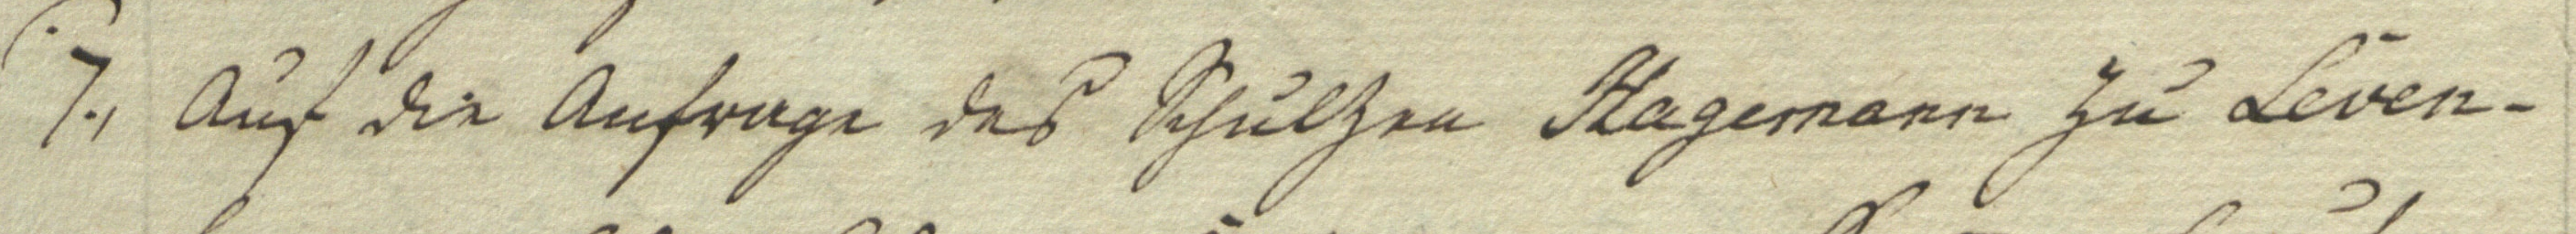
7., Auf die Anfrage des Schulzen Hagemann zu Leven¬
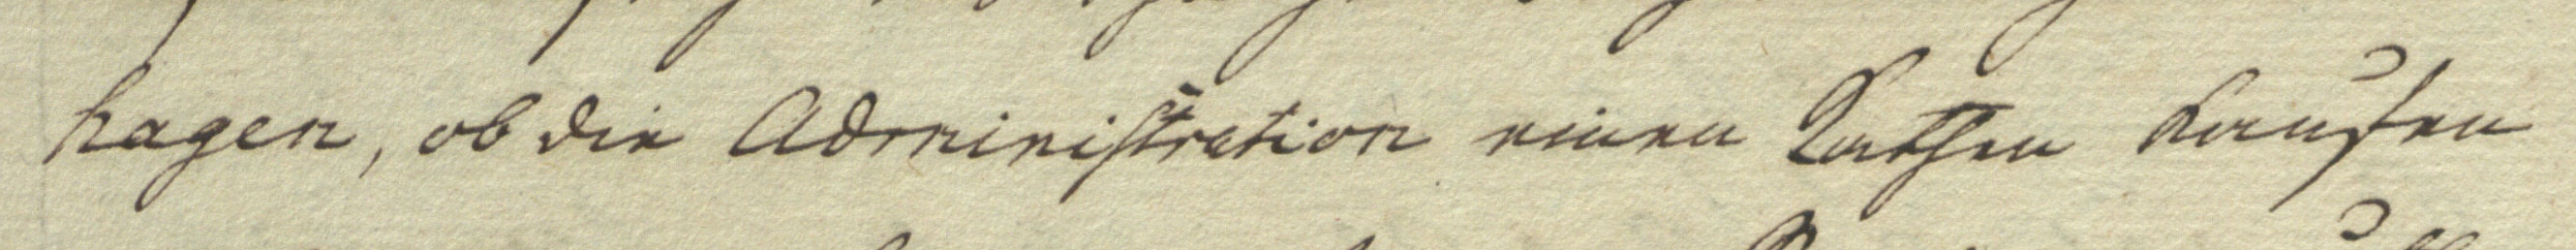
hagen, ob die Administration einen Kathen kaufen
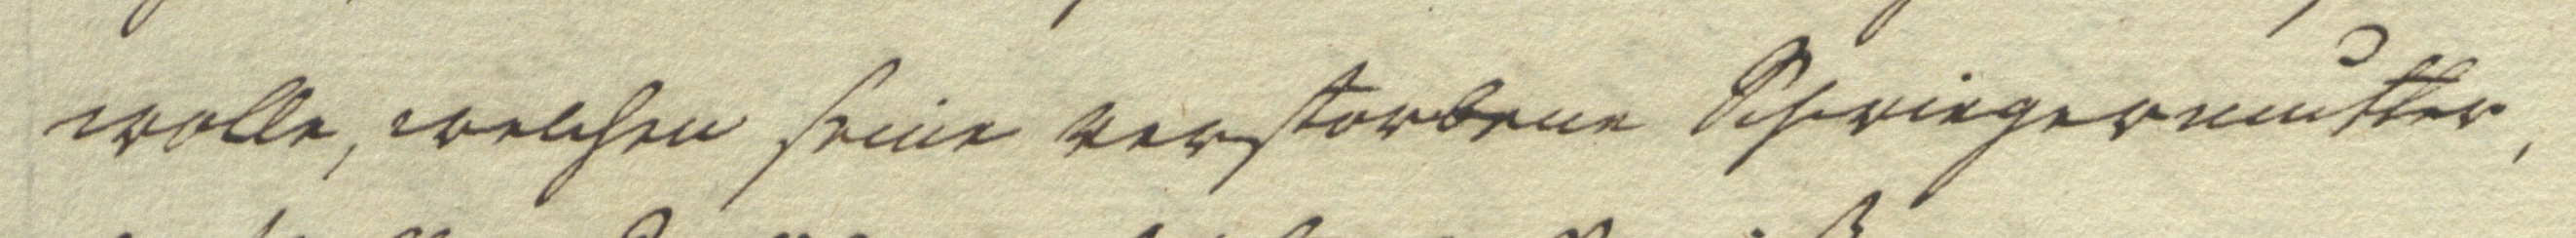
wolle, welchen seine verstorbene Schriegermutter,
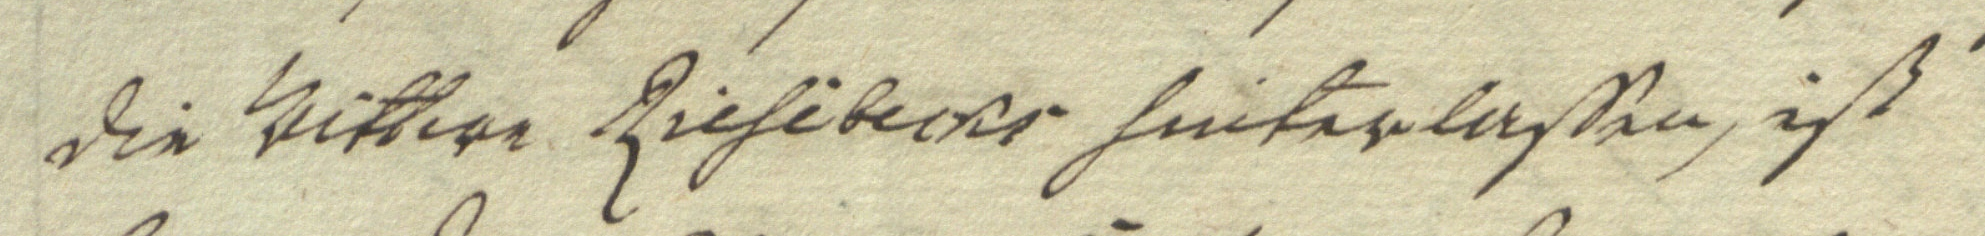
die Wittwe Riesebecks hinterlassen, ist
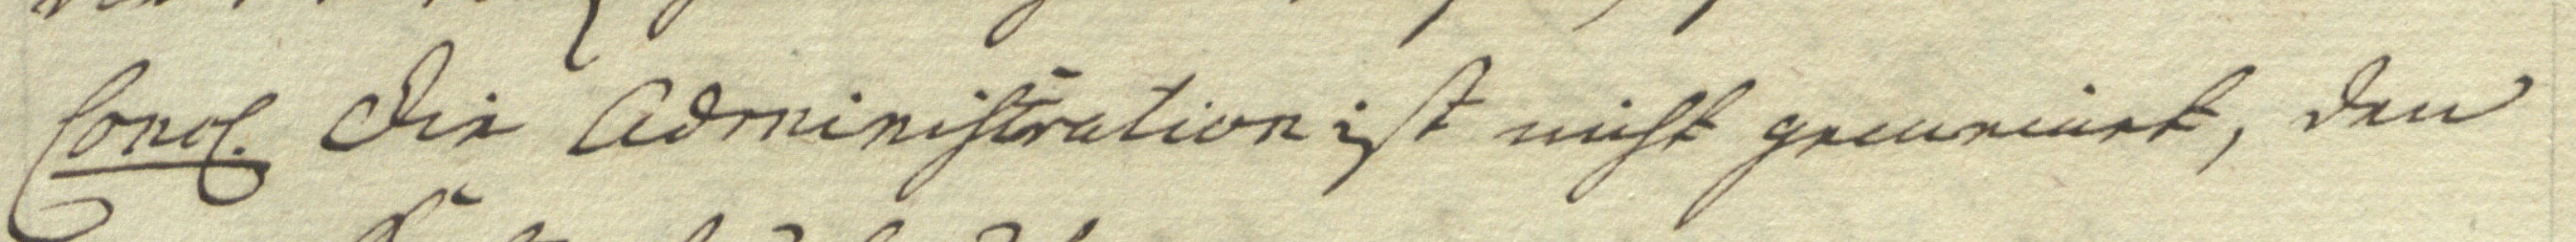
Concl. Die Administration ist nicht gemeinet, den
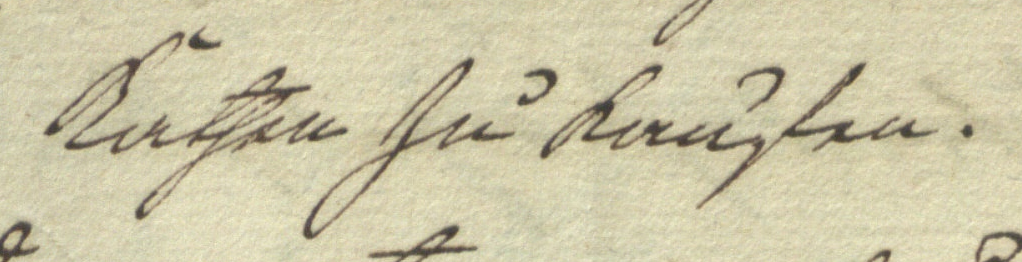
Kathen zu kaufen.
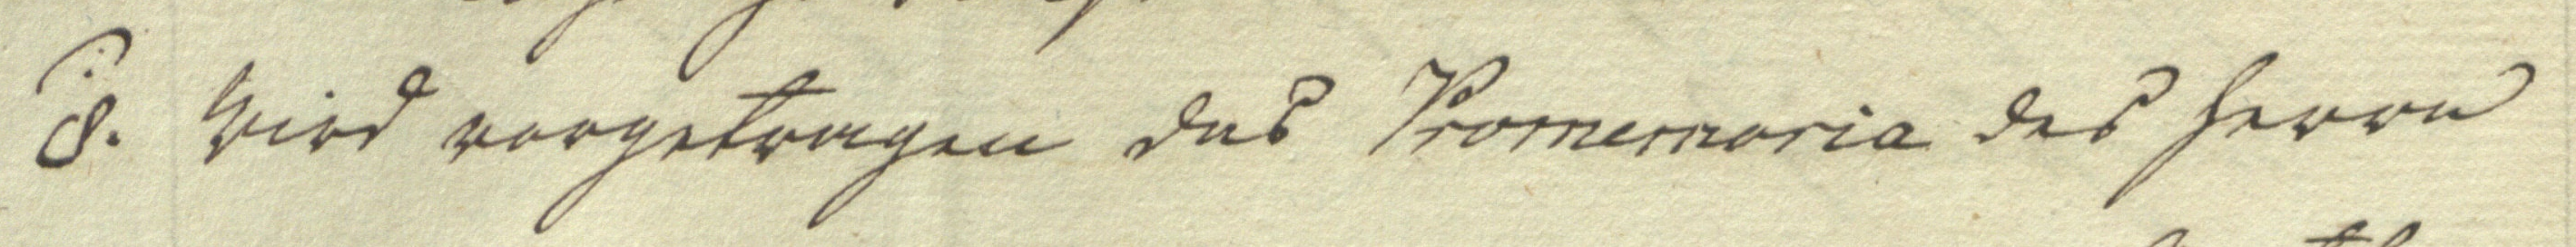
8. Wird vorgetragen das Promemoria des Herrn
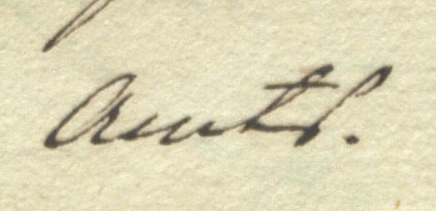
Amts¬
